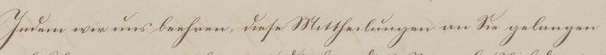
Indem wir uns beehren, diese Mittheilungen an Sie gelangen
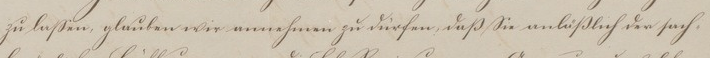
zu laßen, glauben wir annehmen zu dürfen, daß Sie anläßlich der sach-
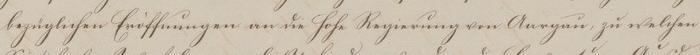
bezüglichen Eröffnungen an die hohe Regierung von Aargau, zu welchen
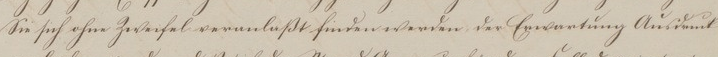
Sie sich ohne Zweifel veranlaßt finden werden, der Erwartung Ausdruck
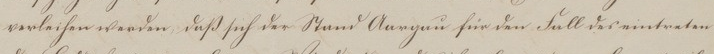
verleihen werden, daß sich der Stand Aargau für den Fall des eintreten-
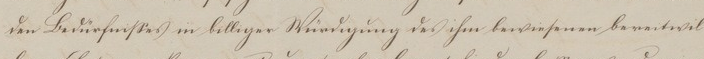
den Bedürfnißes in billiger Würdigung des ihm bewiesenen bereitwil-
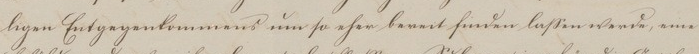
ligen Entgegenkommens um so eher bereit finden laßen werde, eine
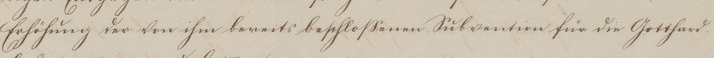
Erhöhung der von ihm bereits beschloßenen Subvention für die Gotthard -
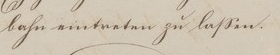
bahn eintreten zu laßen.
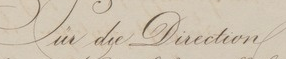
Für die Direction
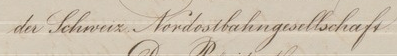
der Schweiz. Nordostbahngesellschaft:
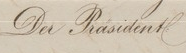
Der Präsident:
